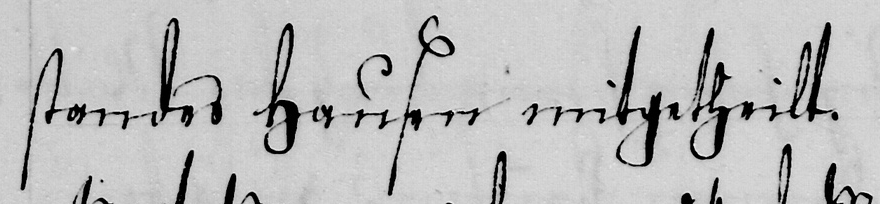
standes Hausen mitgetheilt.
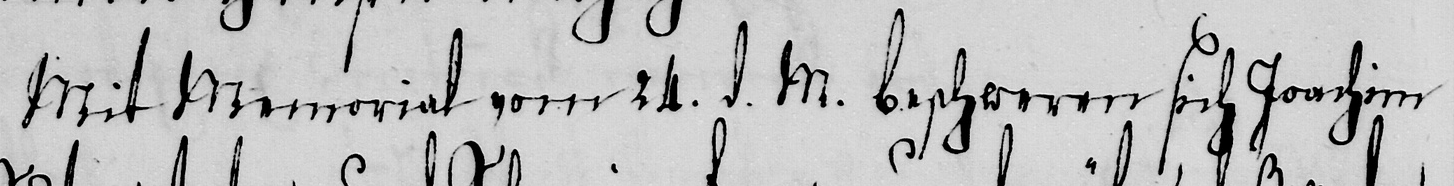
Mit Memorial vom 24. d. M. beschweren sich Joachim
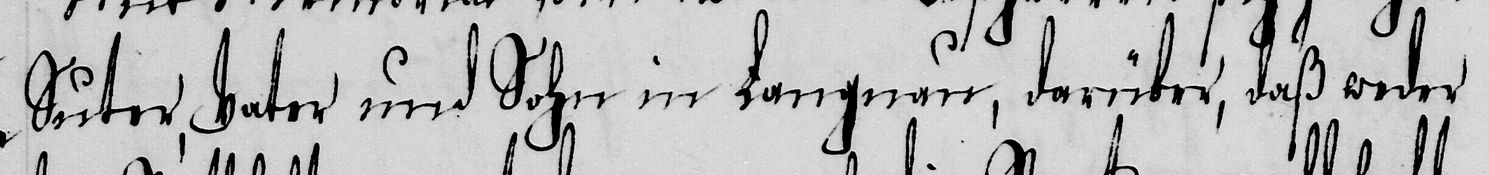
Suter, Vater und Sohn in Langnau, darüber, daß weder
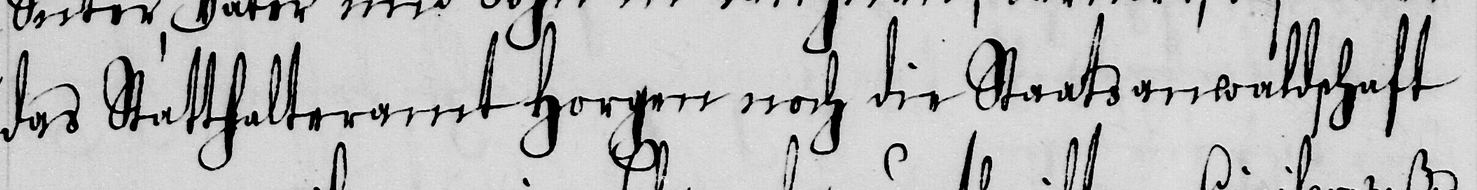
das Statthalteramt Horgen noch die Staatsanwaldschaft
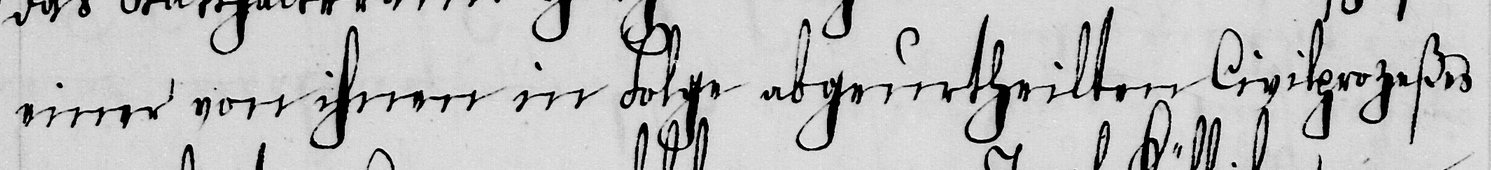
einer von ihnen in Folge abgeurtheilten Civilproceßes
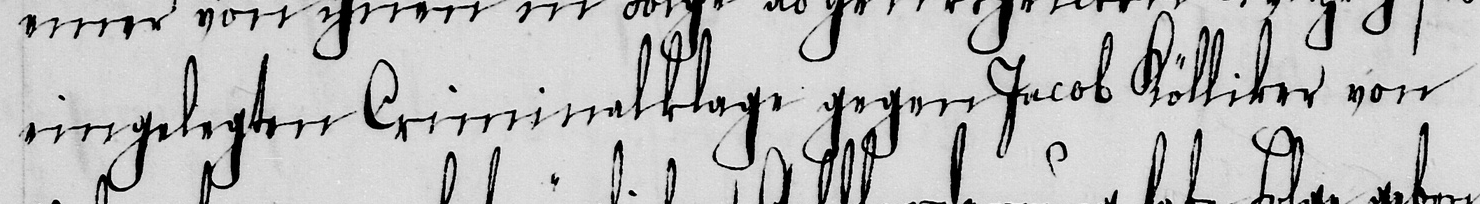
eingelegten Criminalklage gegen Jacob Kölliker von
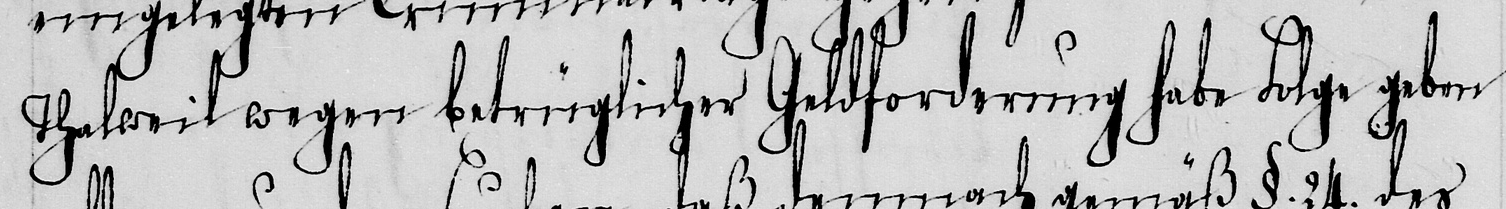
Thalweil wegen betrüglicher Geldforderung habe Folge geben
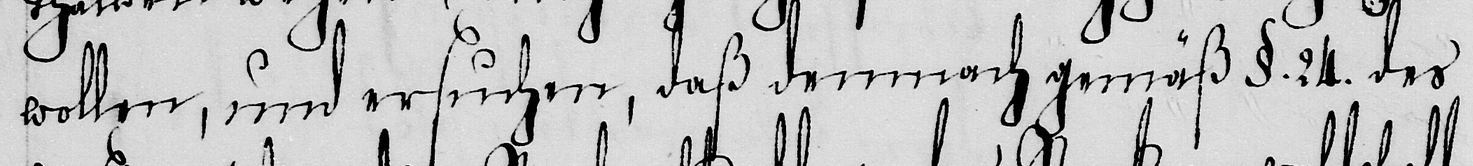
wollen, und ersuchen, daß demnach gemäß §.24. des
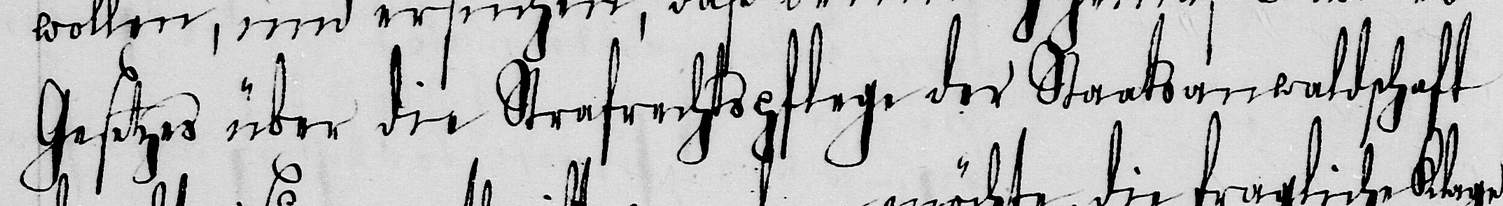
Gesetzes über die Strafrechtspflege der Staatsanwaldschaft
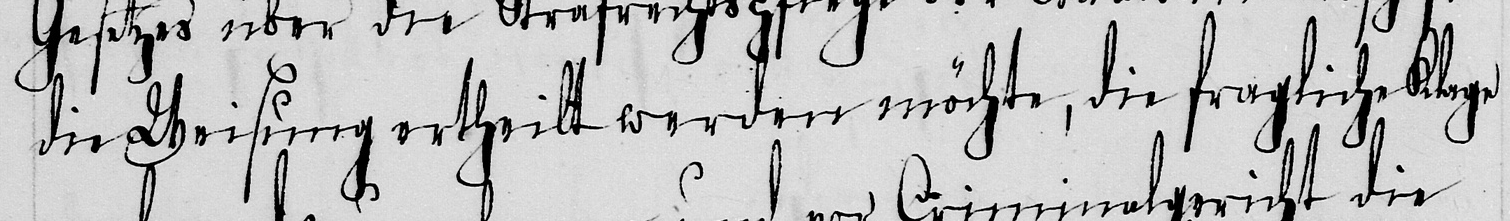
die Weisung ertheilt werden möchte, die fragliche Klage
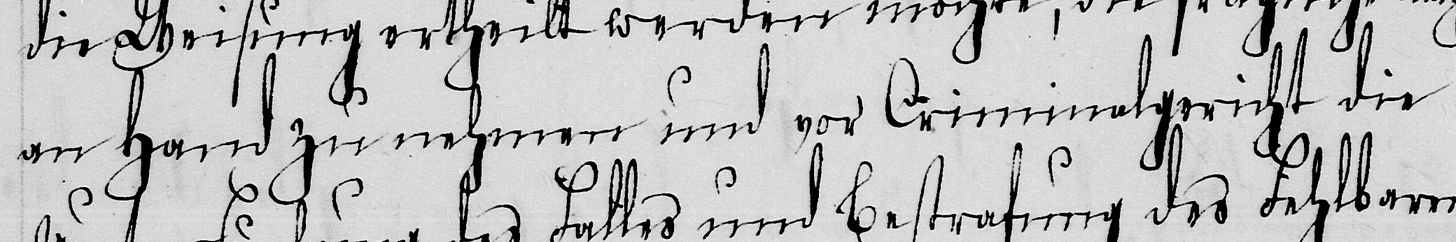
an Hand zu nehmen und vor Criminalgericht die
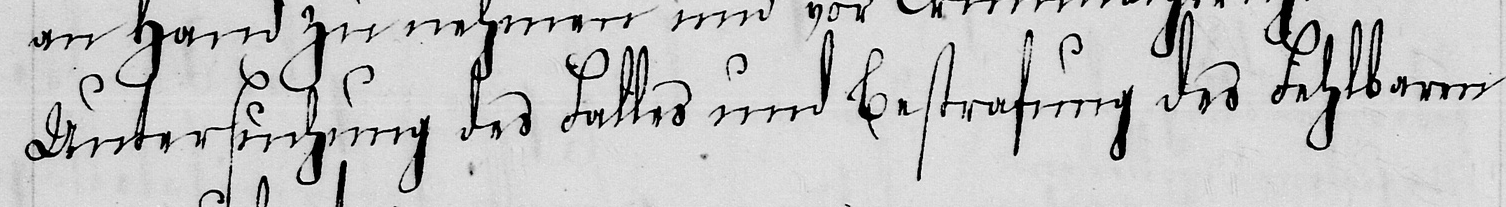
Untersuchung des Falles und Bestrafung des Fehlbaren
